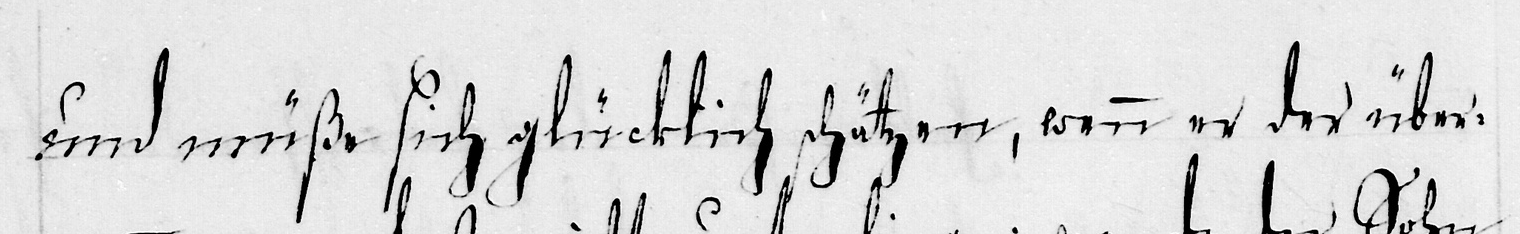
und müße sich glücklich schätzen, wenn er der über¬
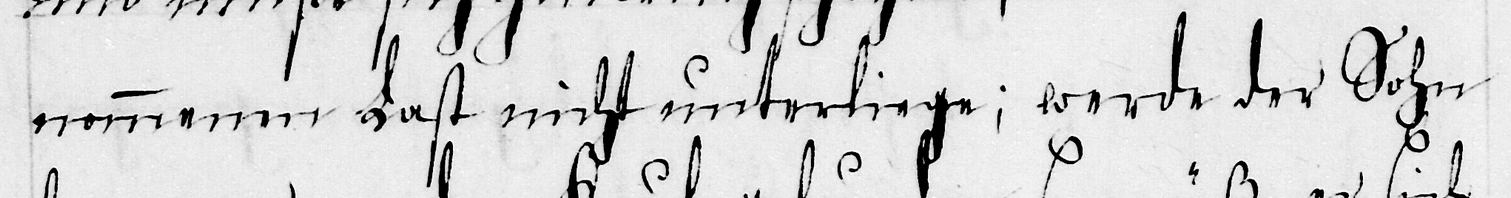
nommenen Last nicht unterliege; werde der Sohn
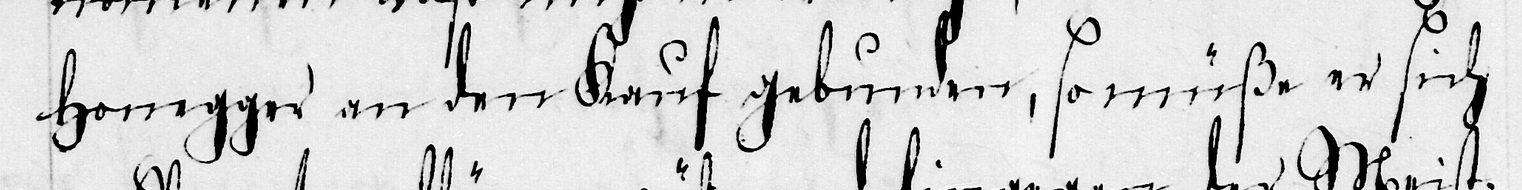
Honegger an den Kauf gebunden, so müße er sich
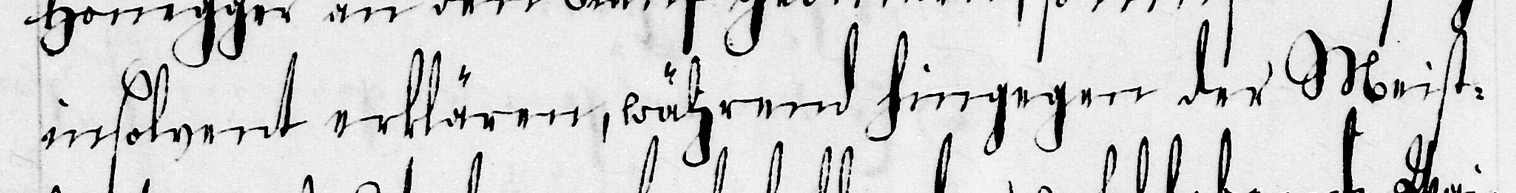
insolvent erklären, während hingegen der Meist¬
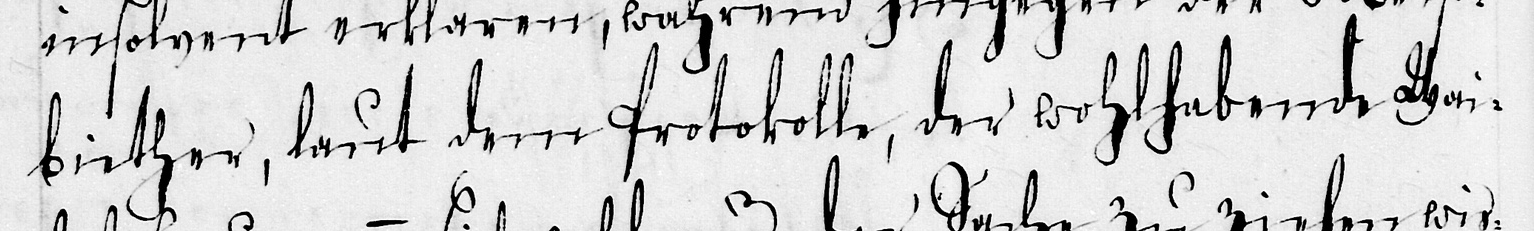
biether, laut dem Protokolle, der wohlhabende Wai¬
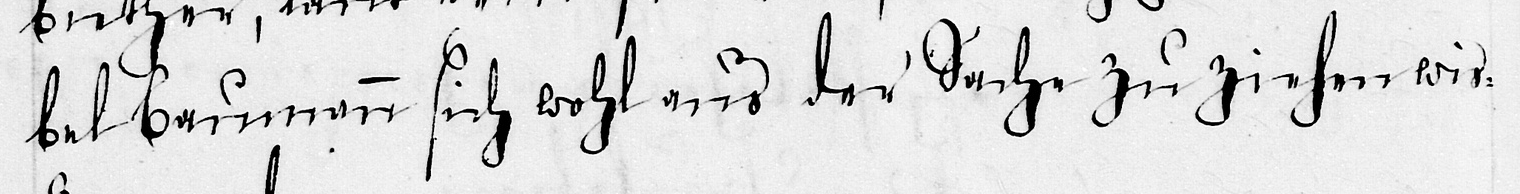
bel Baumann sich wohl aus der Sache zu ziehen wis¬
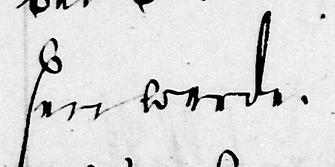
sen werde.
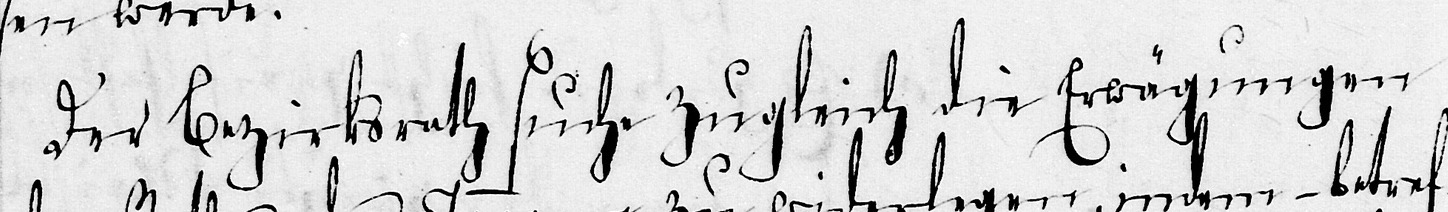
Der Bezirksrath suche zugleich die Erwägungen
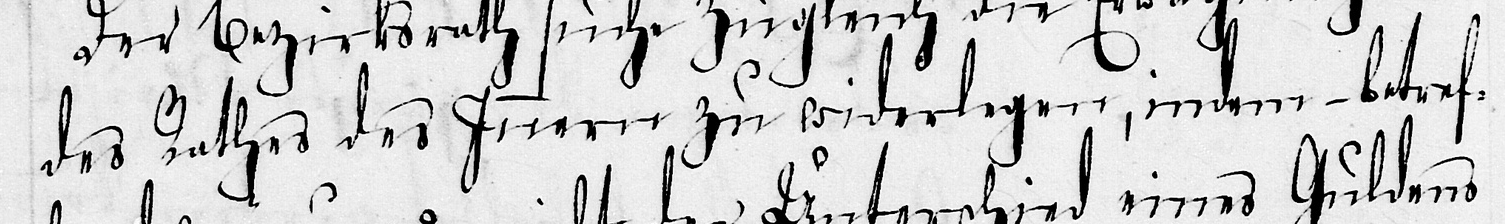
des Rathes des Innern zu widerlegen, indem – betref¬
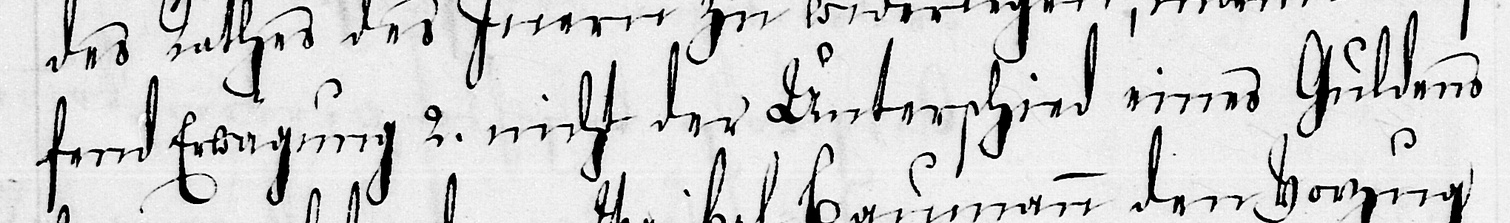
fend Erwägung 2. nicht der Unterschied eines Guldens
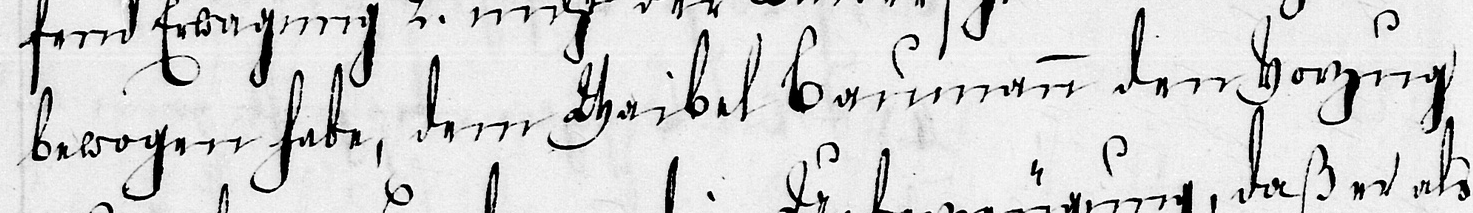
bewogen habe, dem Waibel Baumann den Vorzug
